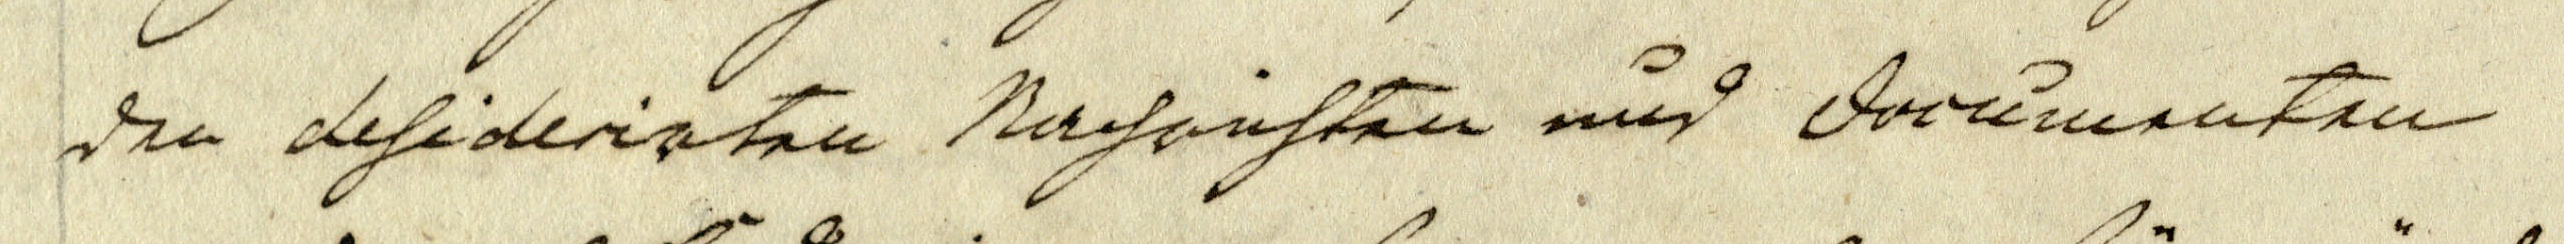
den desiderirten Nachrichten und Documenten
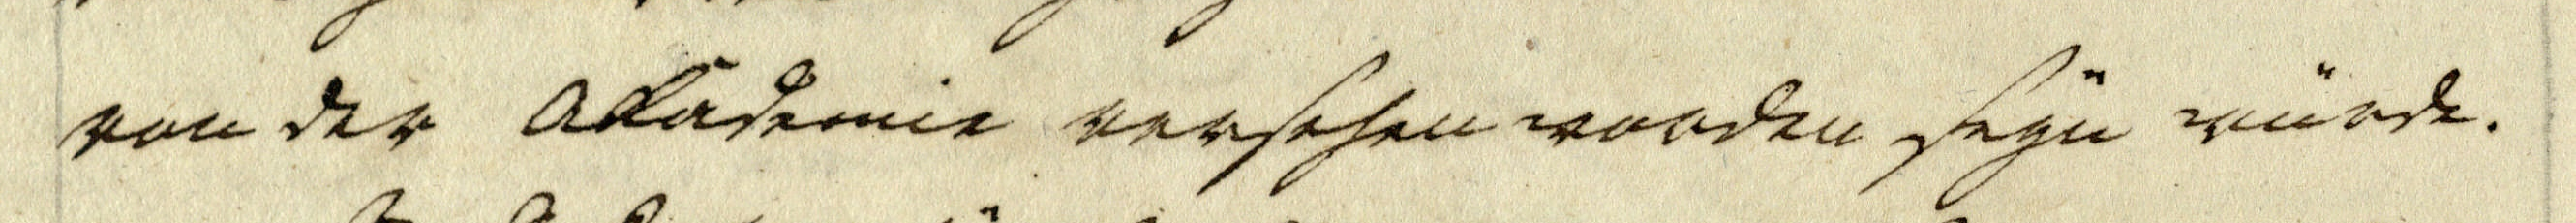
von der Akademie versehen worden seÿn würde.
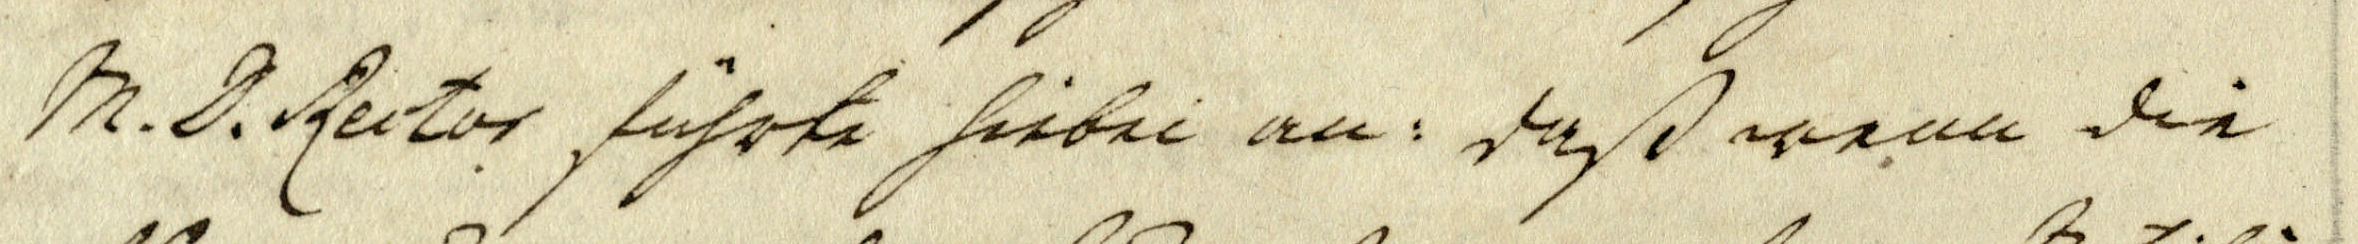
M. D. Rector führte hiebei an: daß wenn die
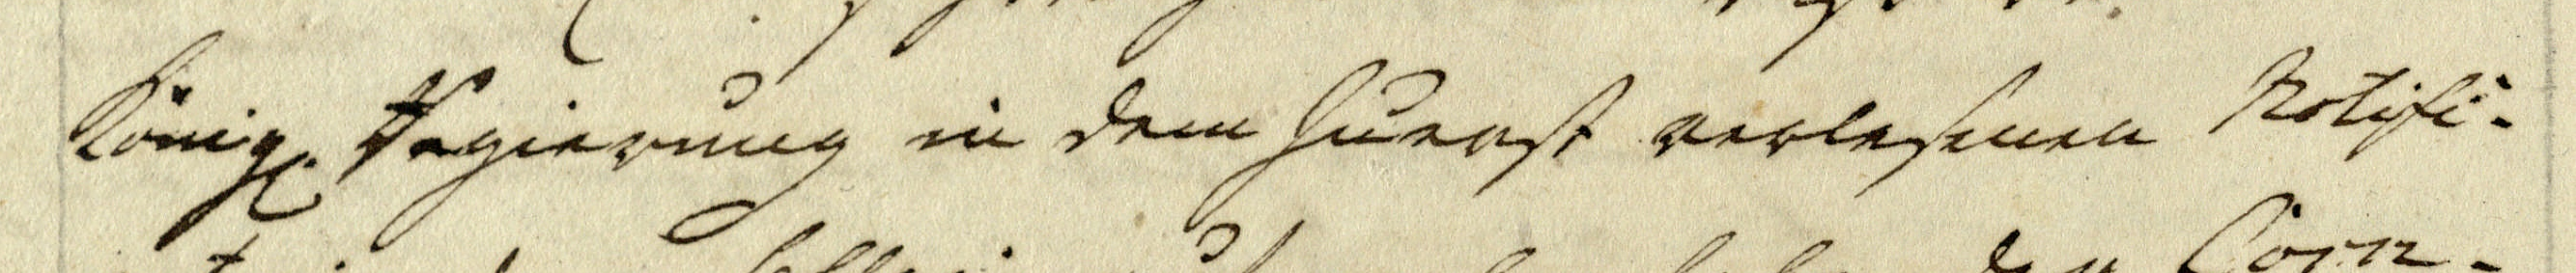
Königl. Regierung in dem zuerst verlesenen Notifi¬
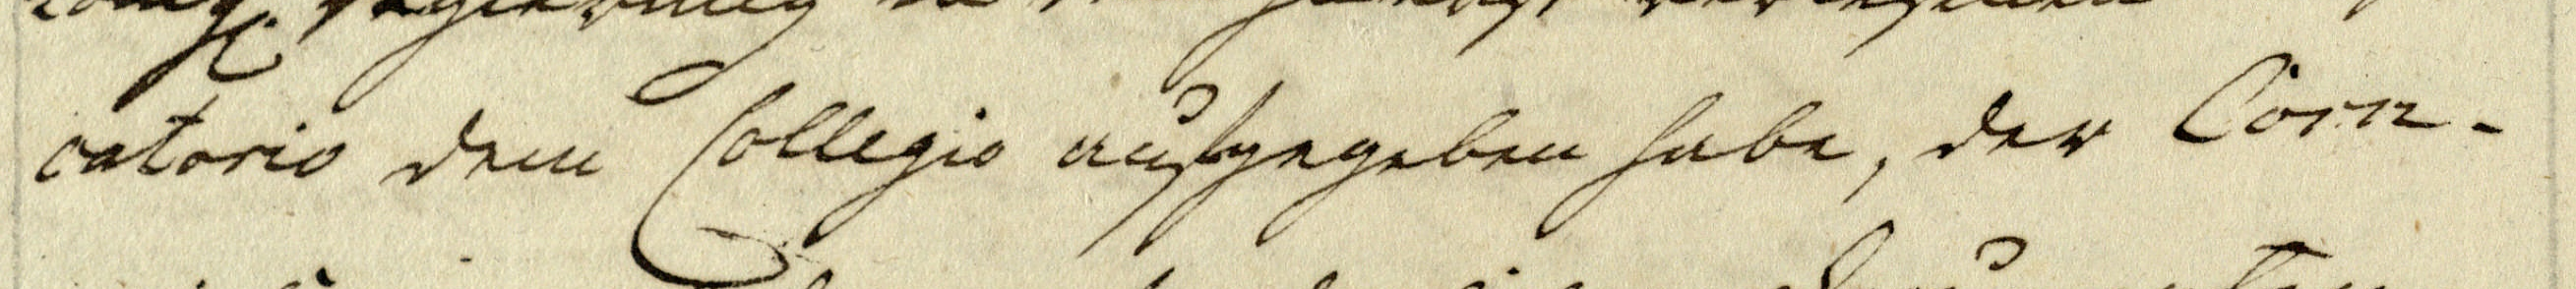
catorio dem Collegio aufgegeben habe, der Com¬
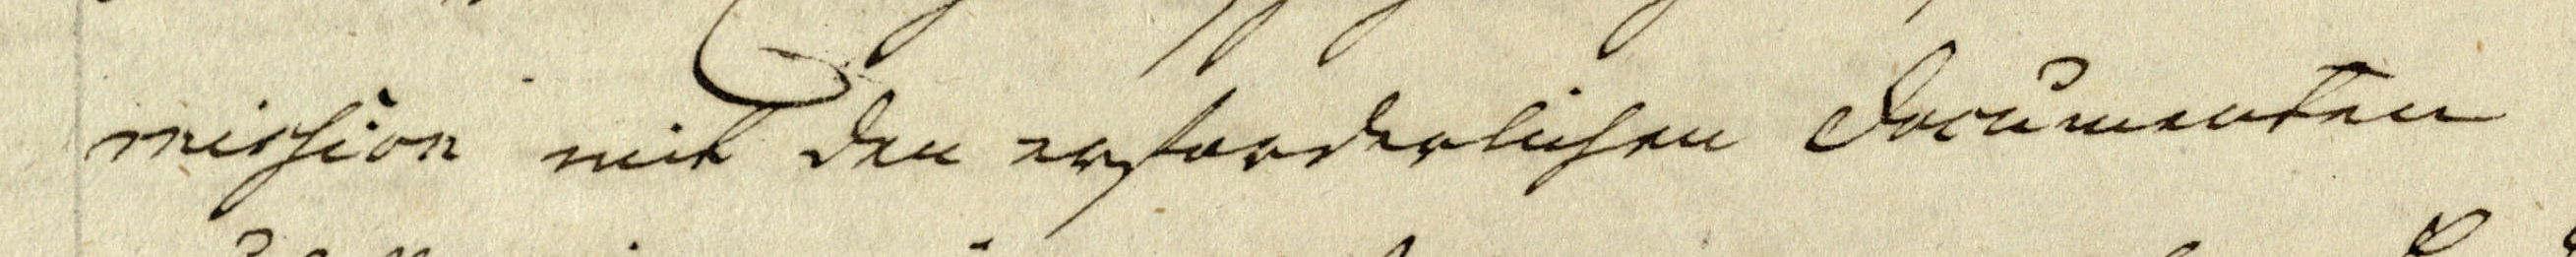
mission mit den erforderlichen Documenten
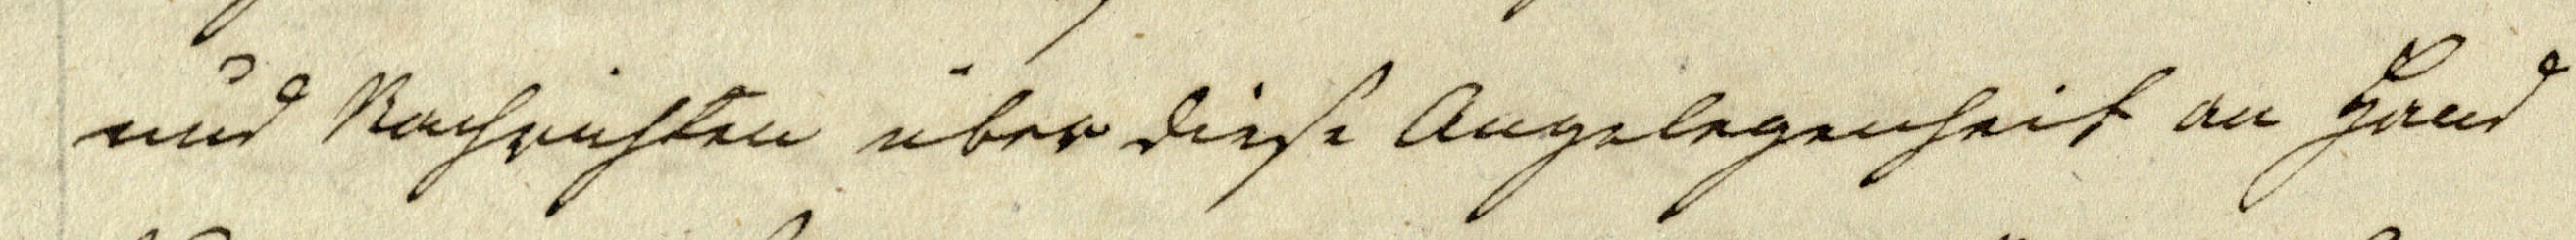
und Nachrichten über diese Angelegenheit an Hand
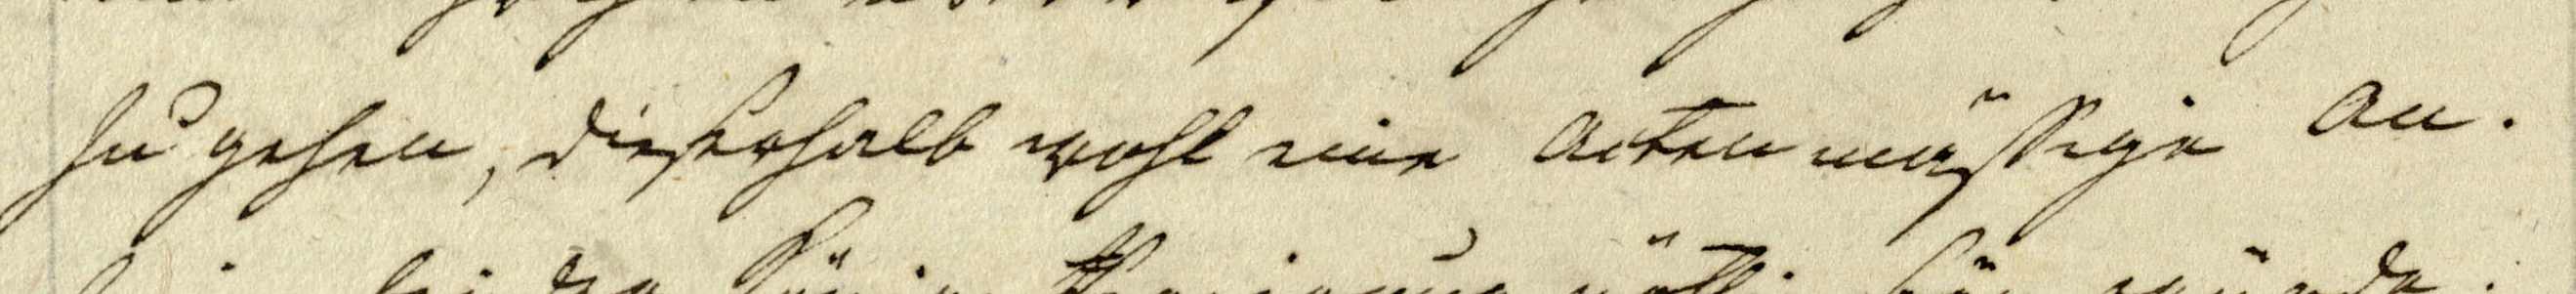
zu gehen, dieserhalb wohl eine Acten mässige An¬
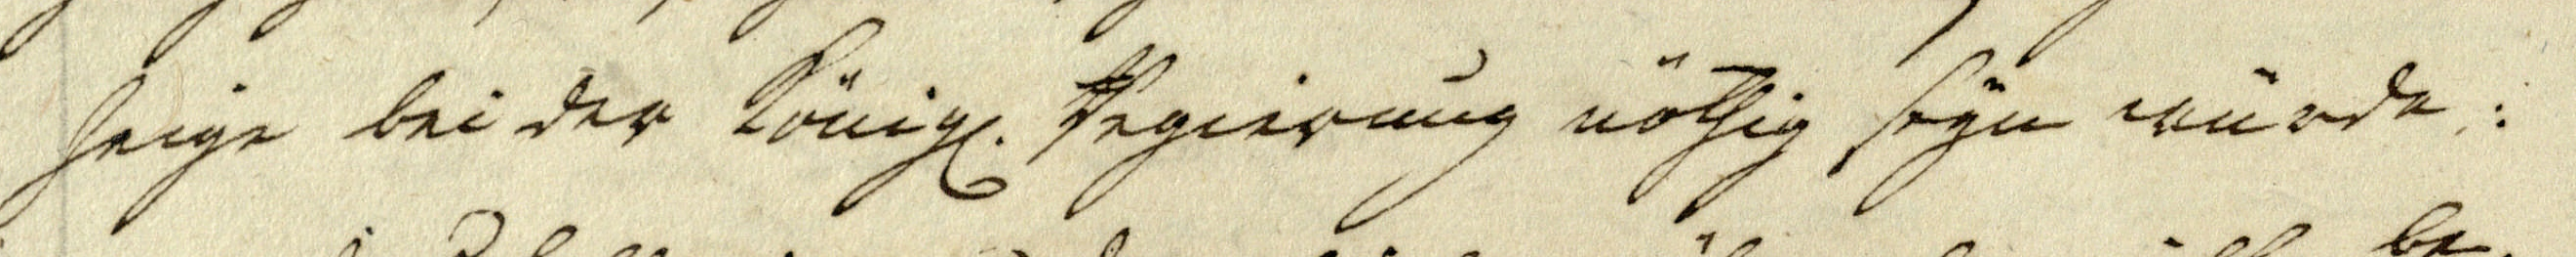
zeige bei der Königl. Regierung nöthig seÿn würde:
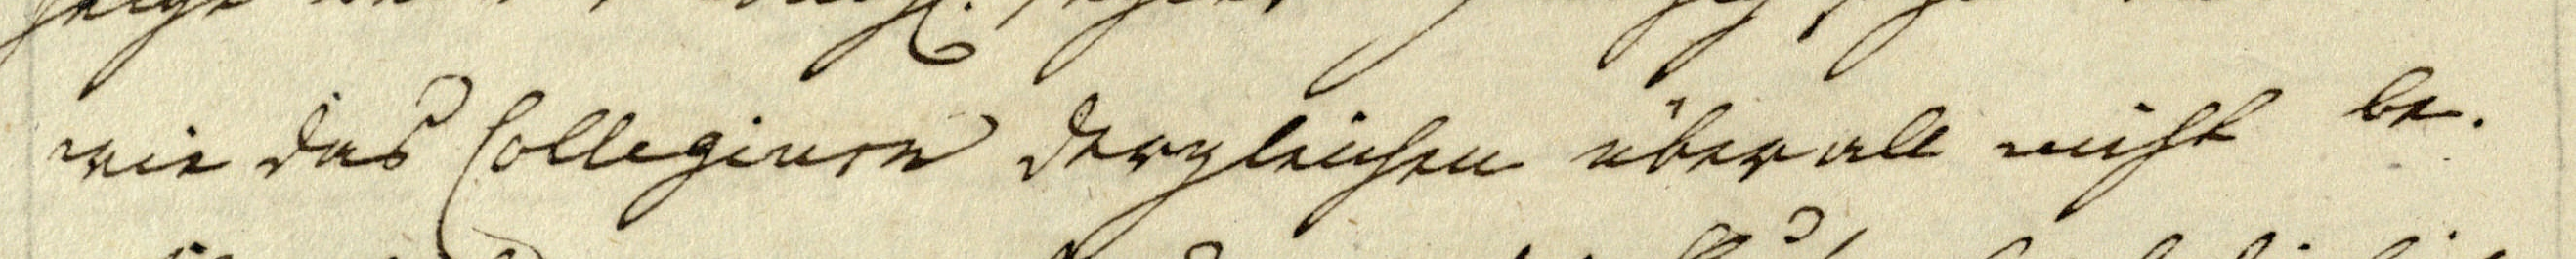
wie das Collegium dergleichen überall nicht be¬
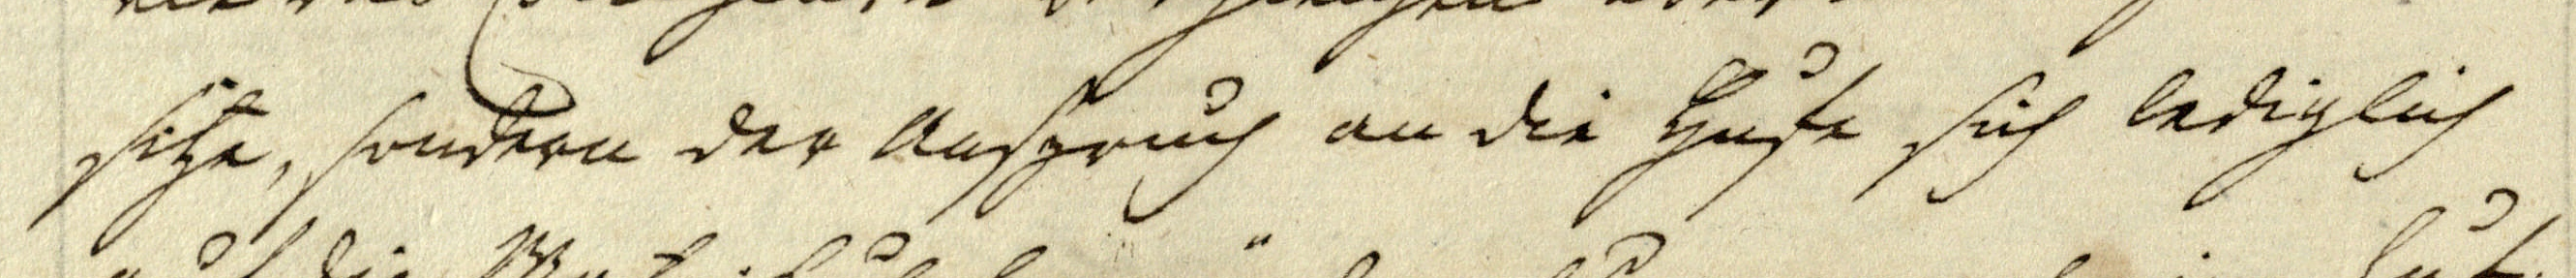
stehe, sondern der Anspruch an die Hufe sich lediglich
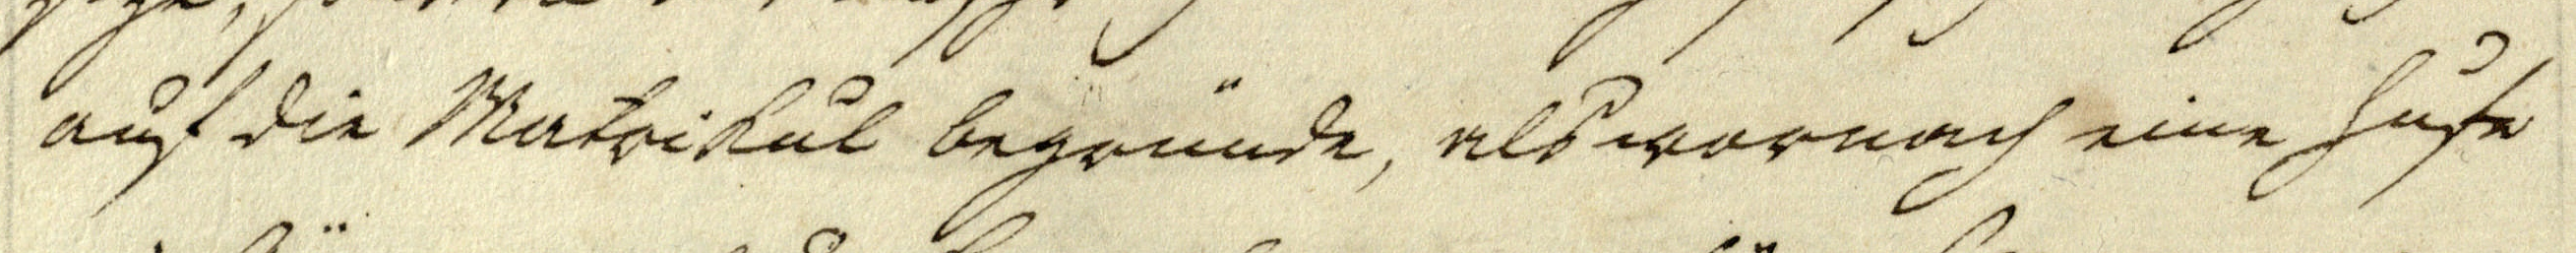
auf die Matrikul begründe, als wornach eine Hufe
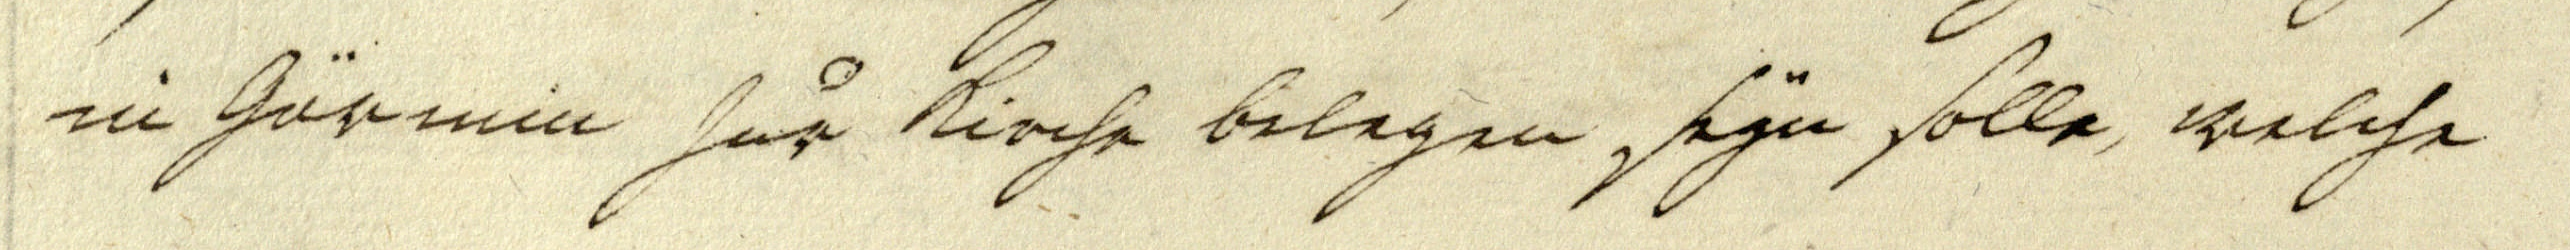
in Görmin zur Kirche beilegen seÿn solle, welche
